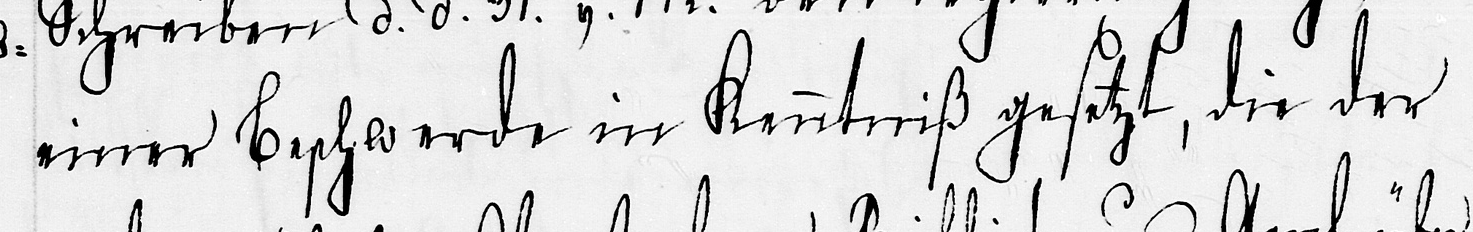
einer Beschwerde in Kenntniß gesetzt, die der
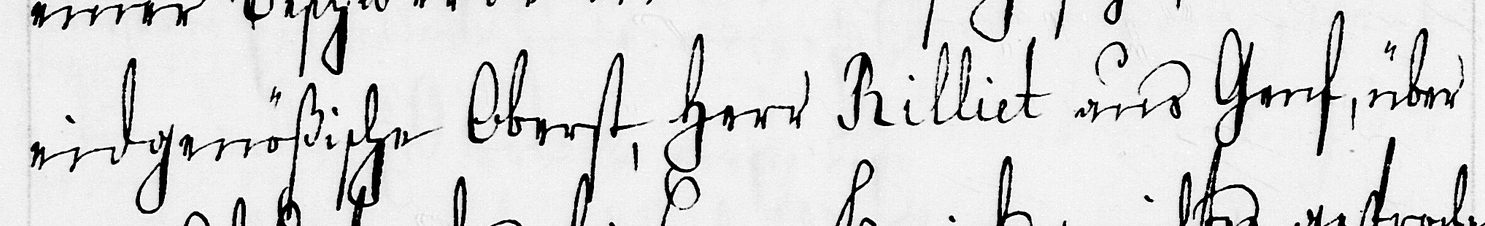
eidgenößische Oberst, Herr Rilliet aus Genf, über
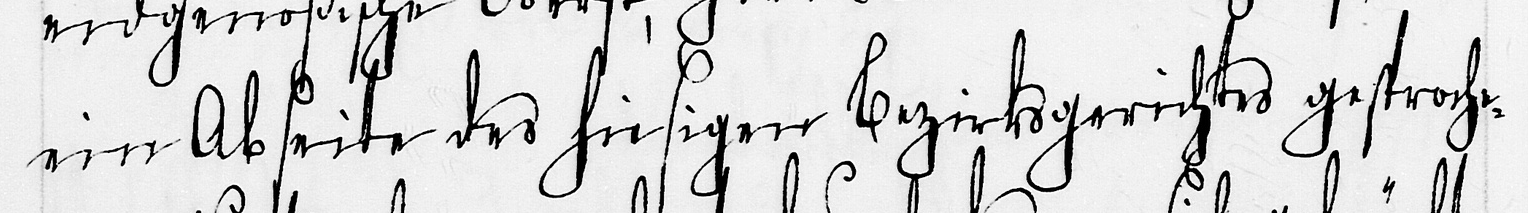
ein Abseite des hiesigen Bezirksgerichtes gesproch¬
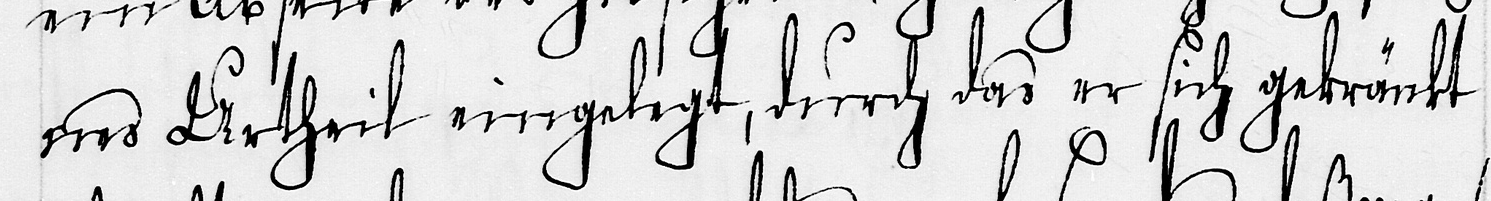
enes Urtheil eingelegt, durch das er sich gekränkt
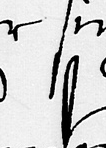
ach¬
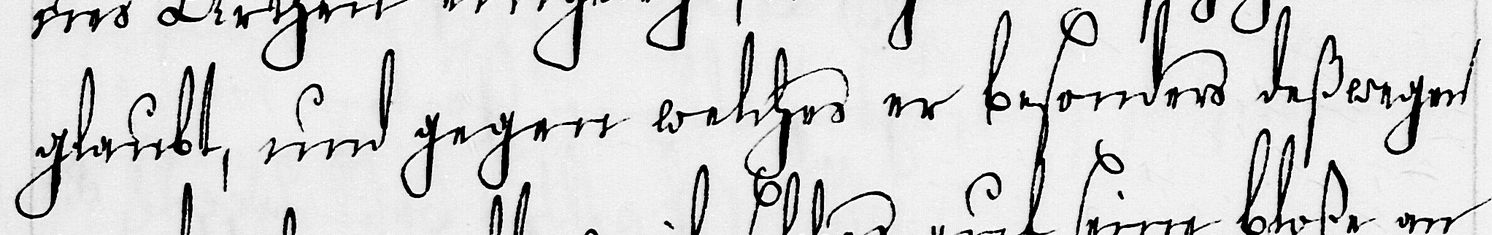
glaubt, und gegen welches er besonders deßwegen
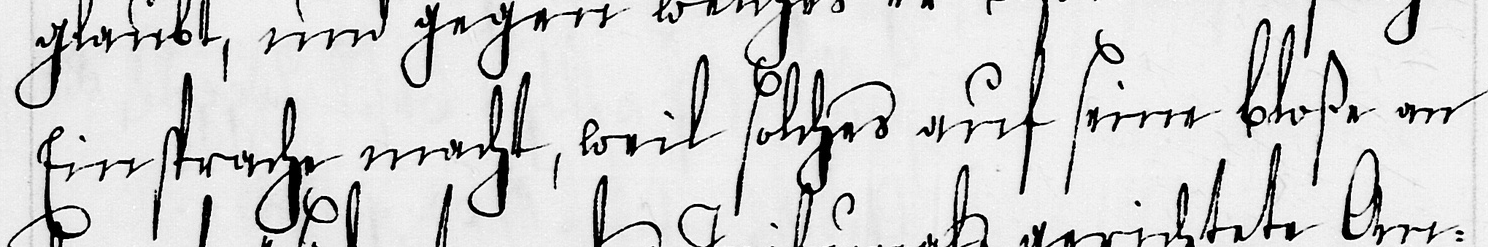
Einsprache macht, weil solches auf seine bloße an
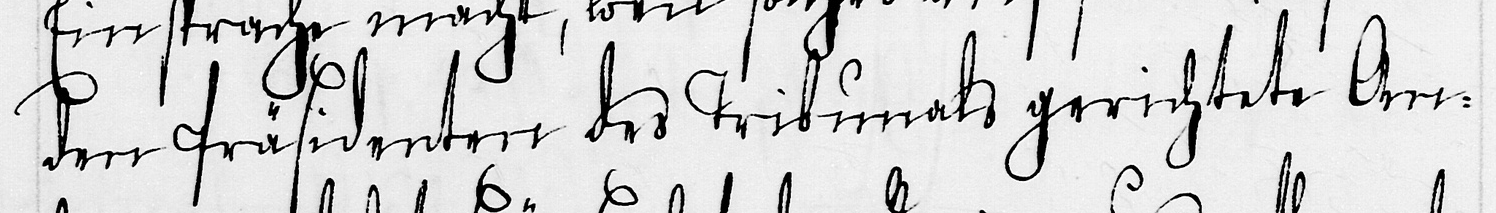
den Präsidenten des Tribunals gerichtete Anf¬
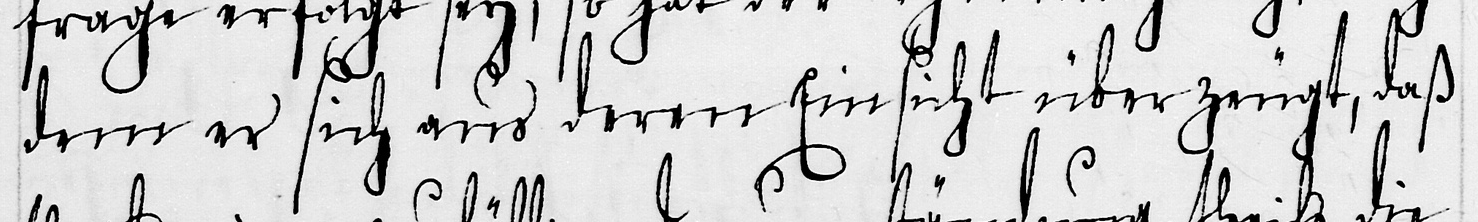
dem er sich aus deren Einsicht überzeugt, daß
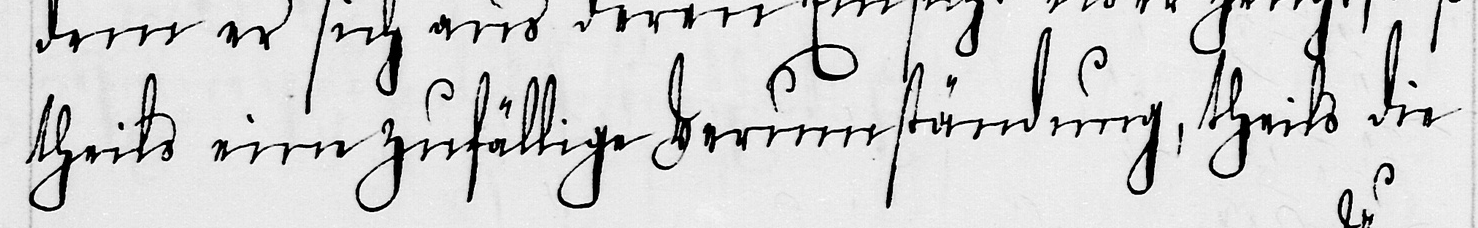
theils eine zufällige Verumständung, theils die
